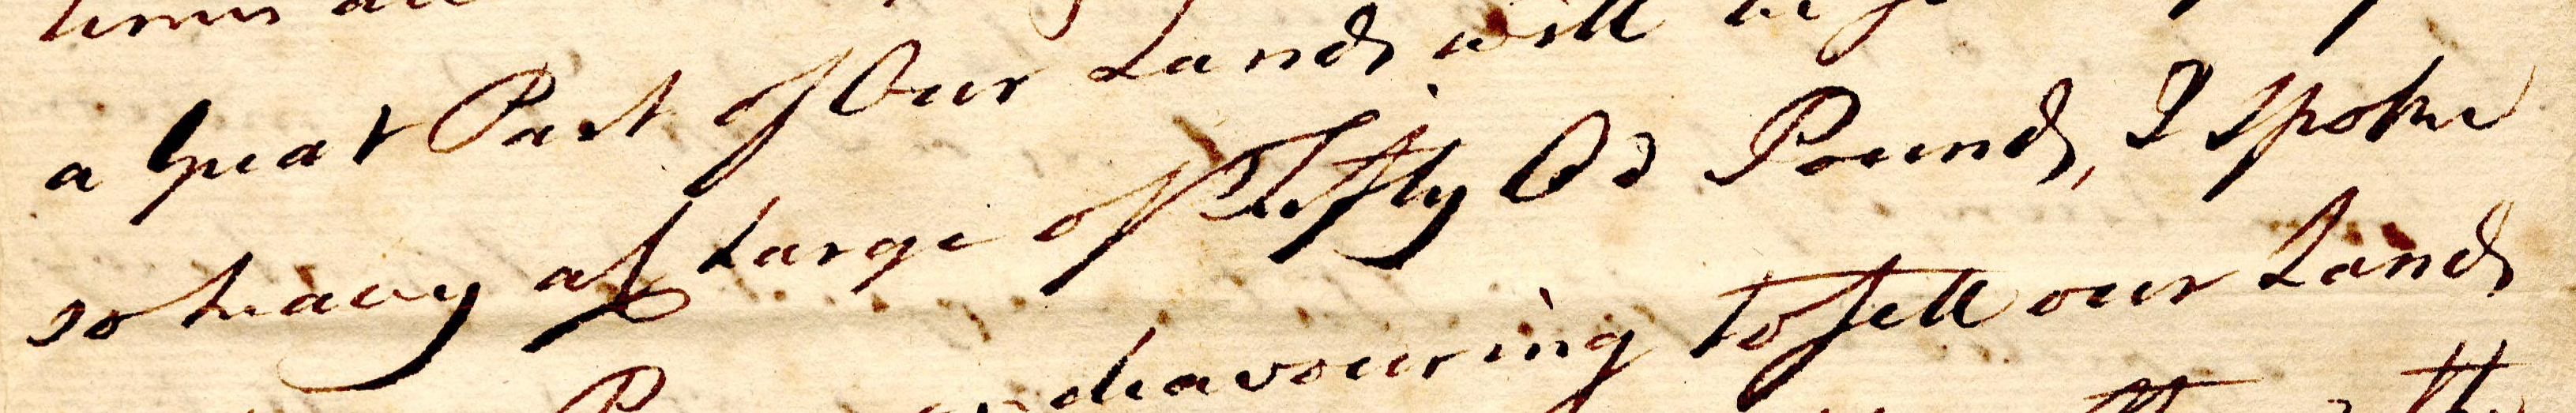so heavy a Charge of fifty Od Pounds, I spoke
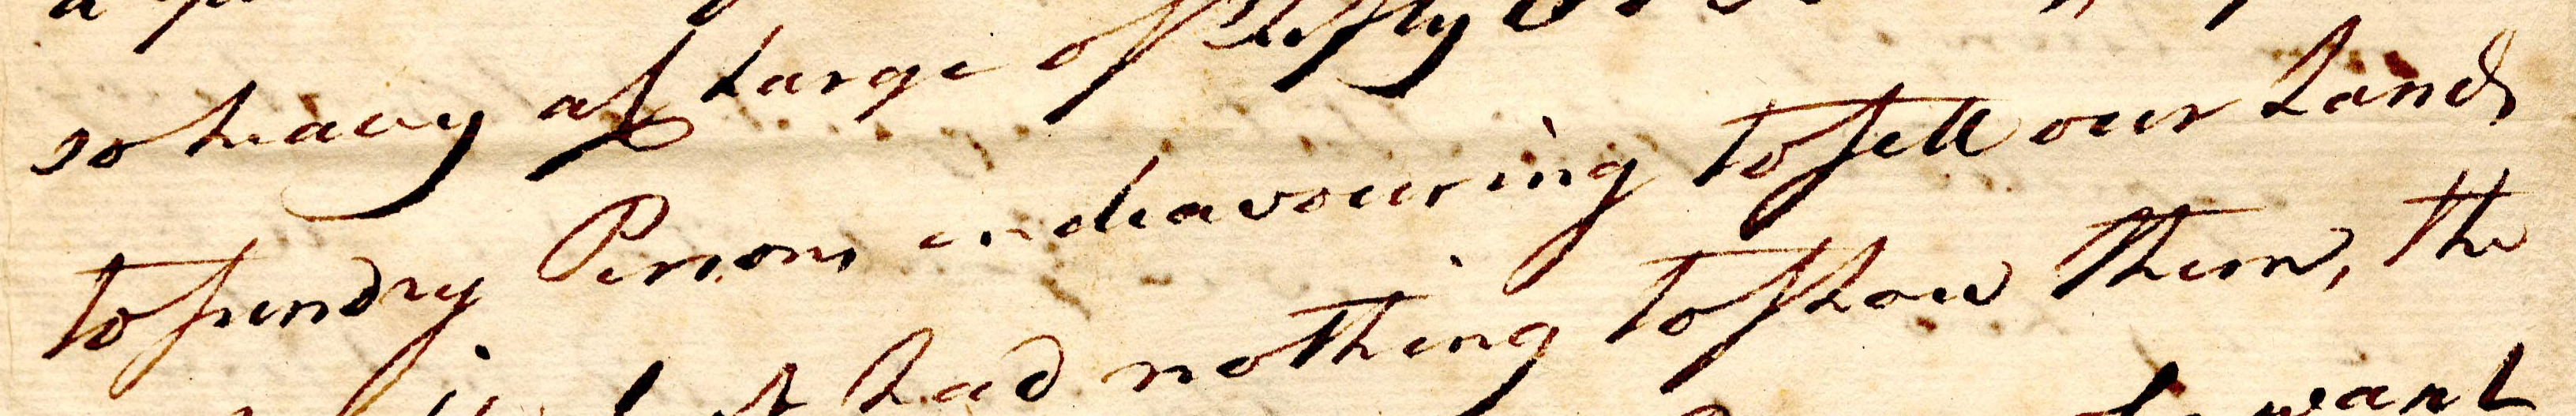to sundry Persons endeavouring to sell our Lands
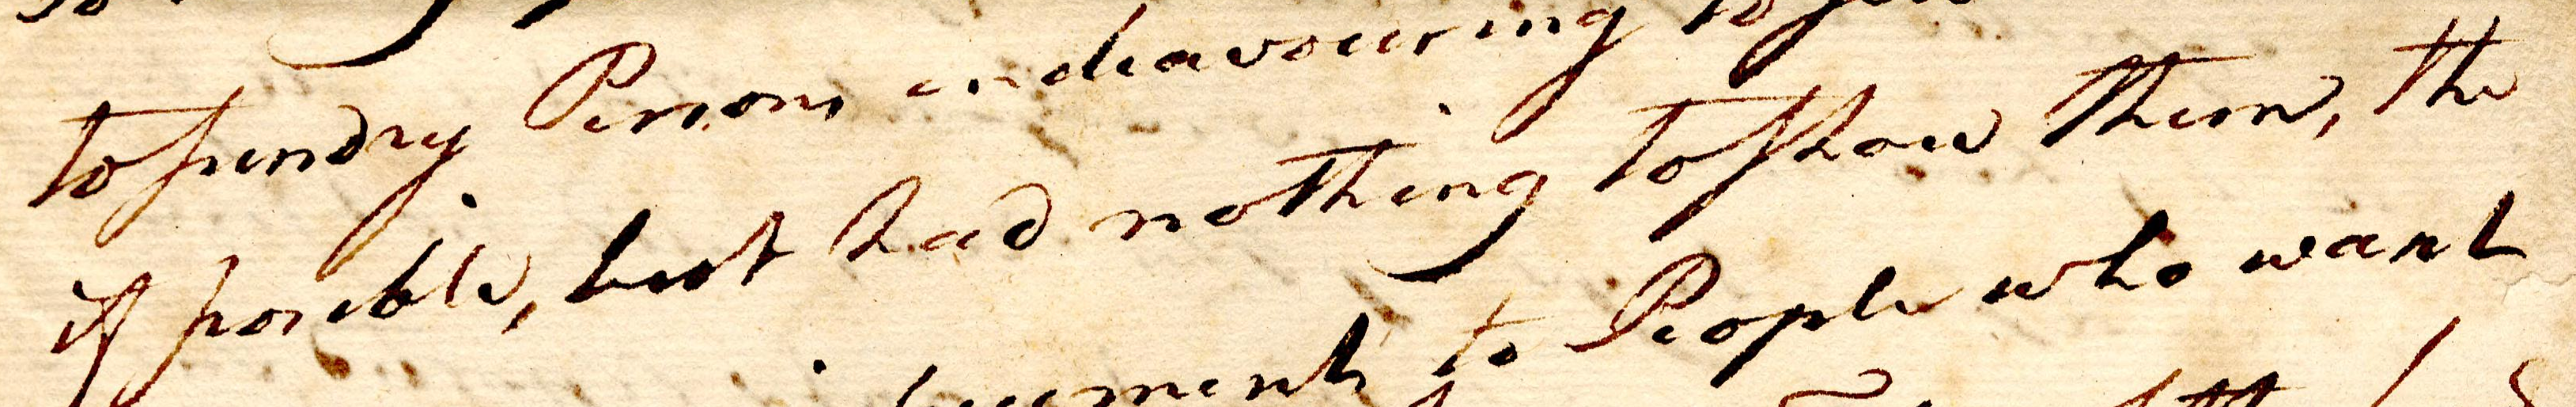if possible, but had nothing to show them, the
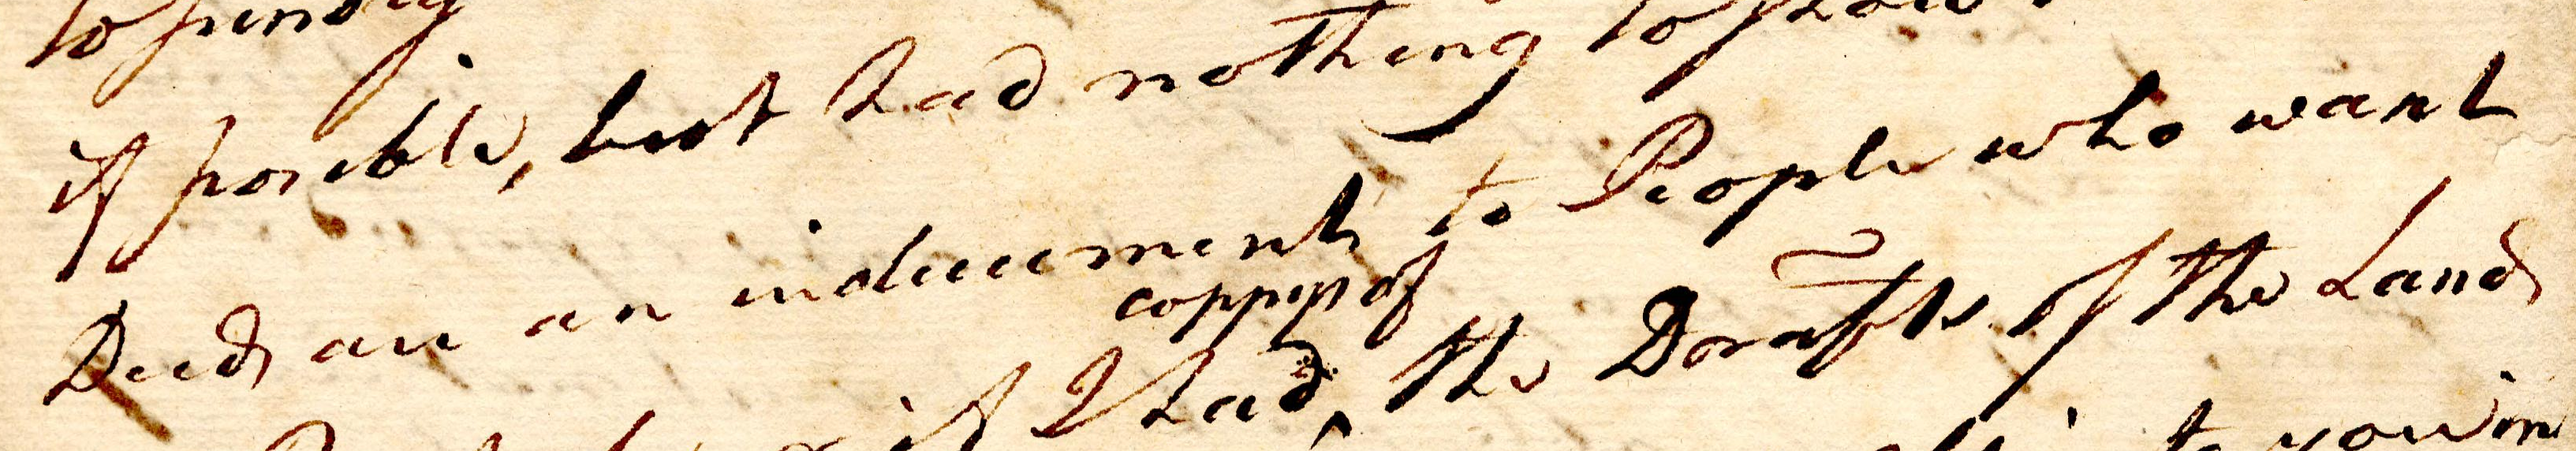Deeds are an indicement to People who want
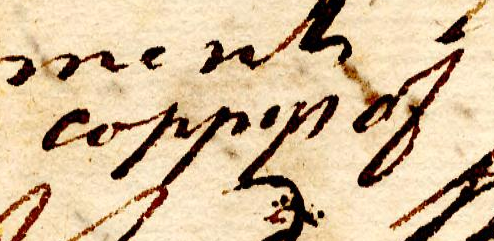coppys of
